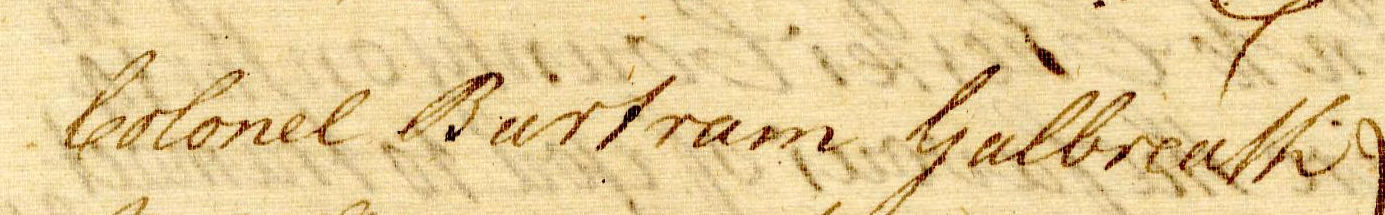Colonel Burtram Galbreath
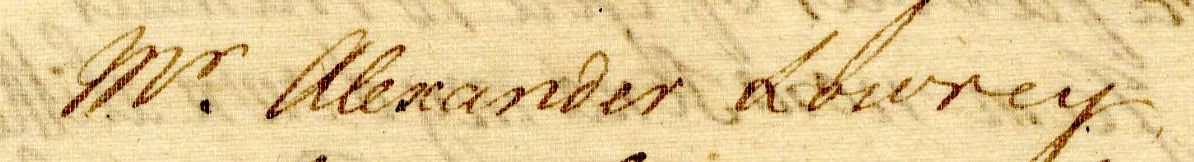M^r. Alexander Lowrey
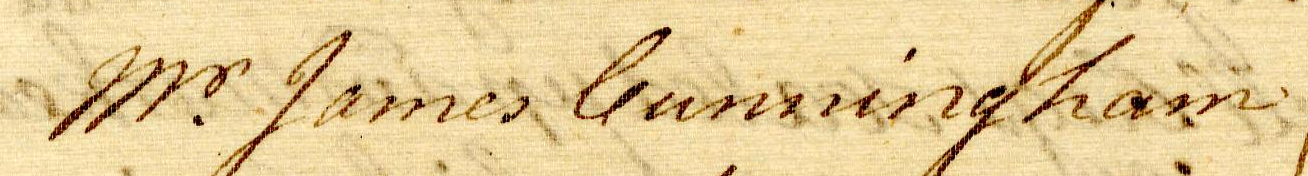M^r. James Cunningham
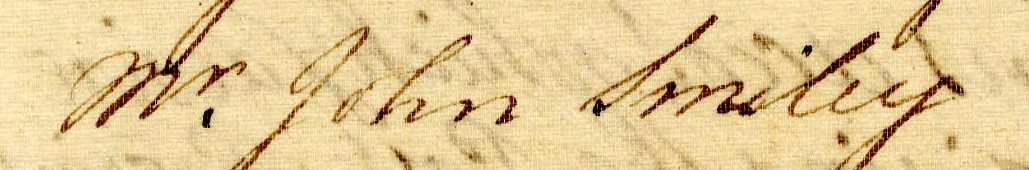M^r. John Smiley
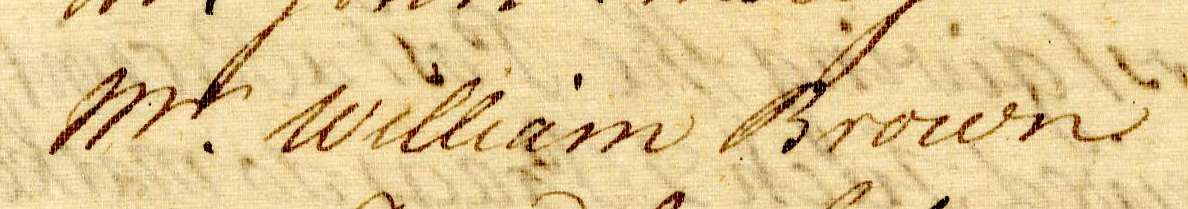M^r. William Brown
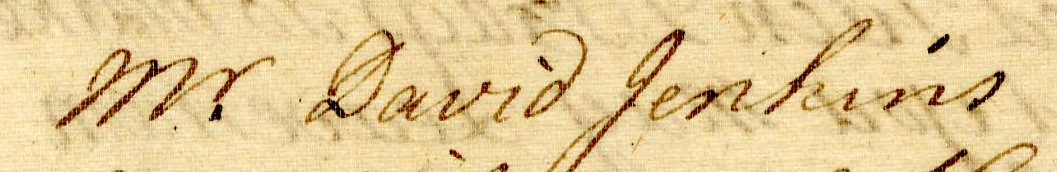M^r. David Jenkins
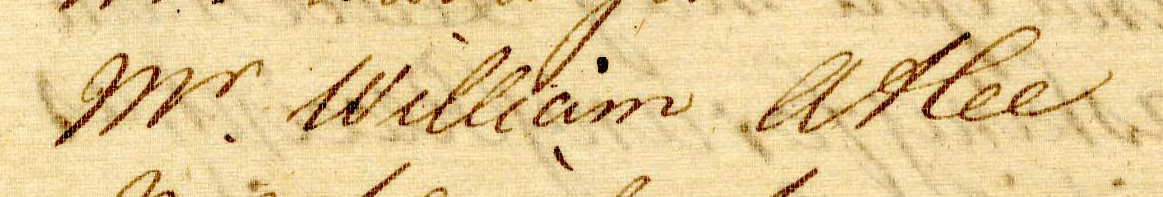M^r. William Atlee
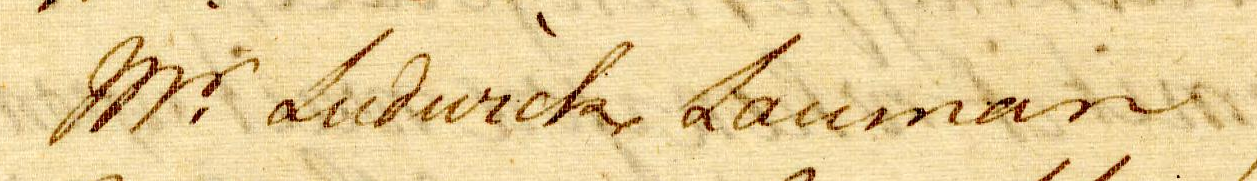M^r Ludwick Lauman
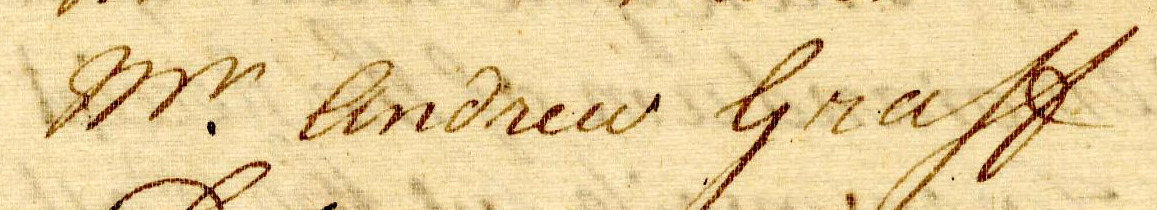M^r. Andrew Graff
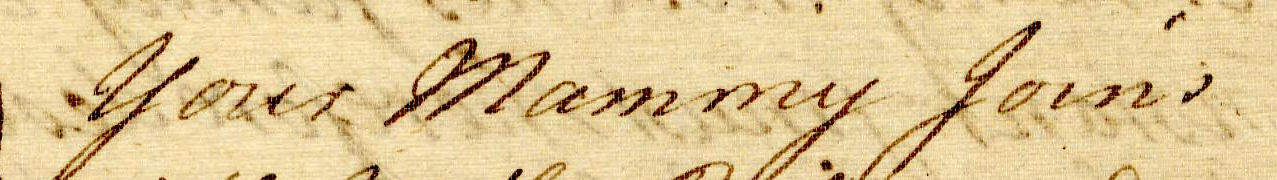Your Mammy Joins
